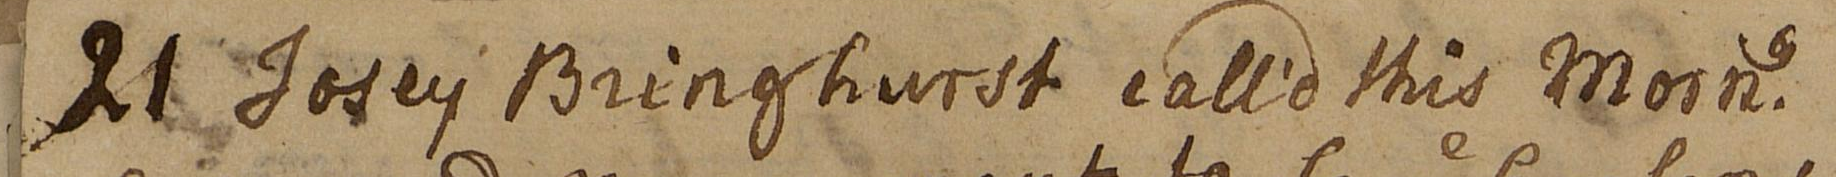21 Josey Bringhurst call'd this Morn^g.
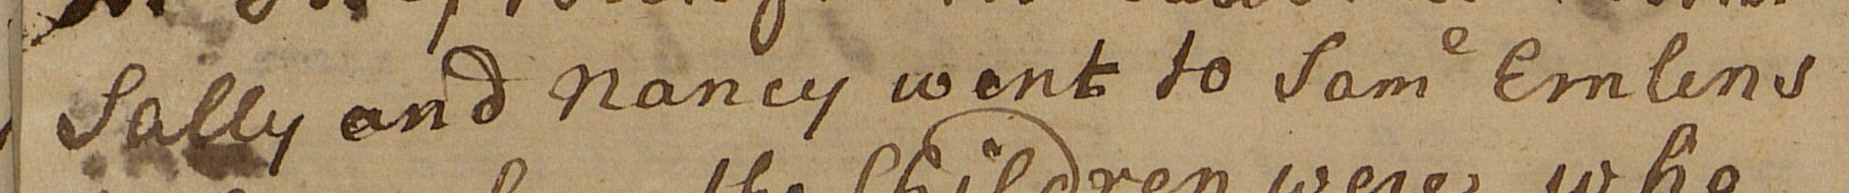Sally and Nancy went to Sam^l. Emlens
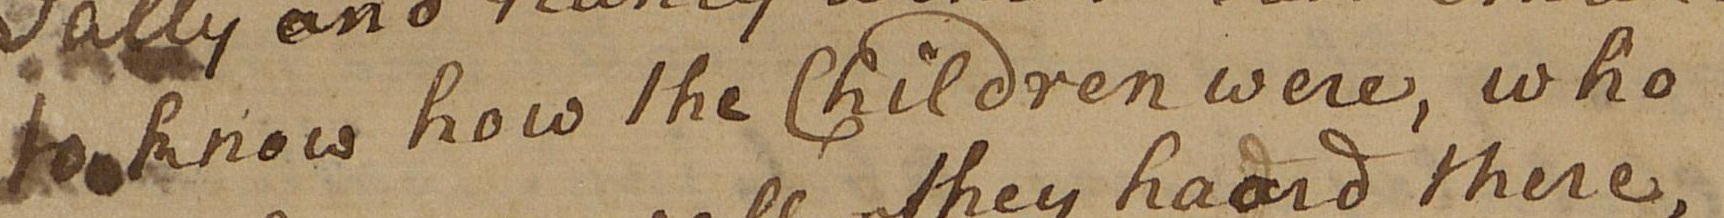to know how the Children were, who
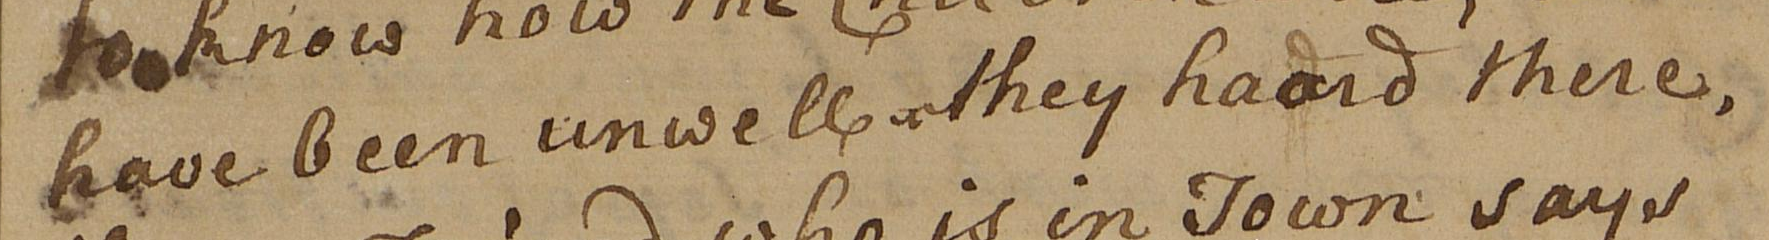have been unwell- they haard there,
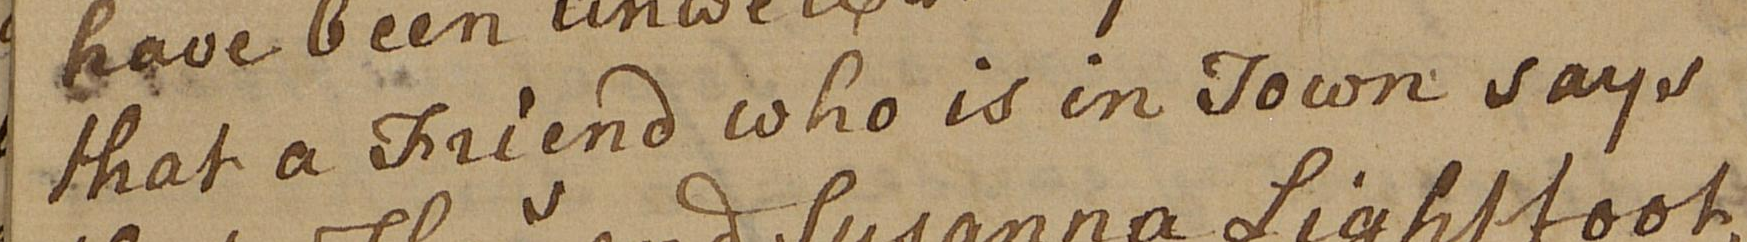that a Friend who is in Town says
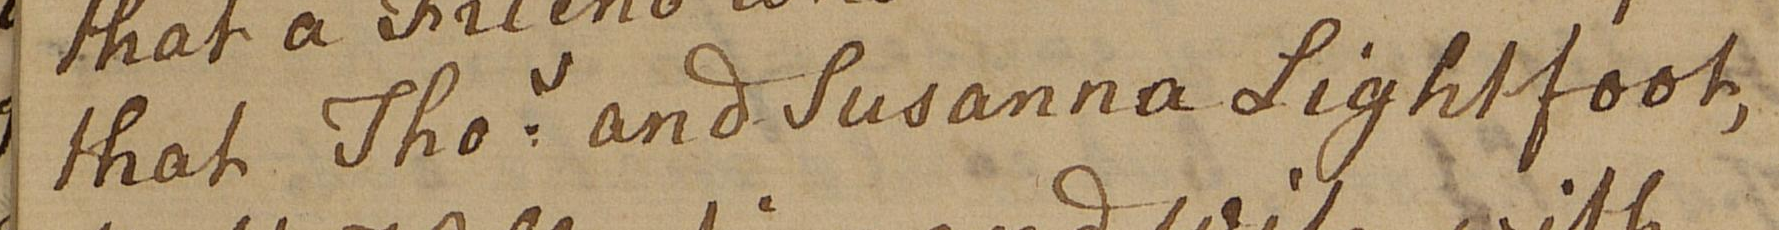that Tho^s. and Susanna Lightfoot
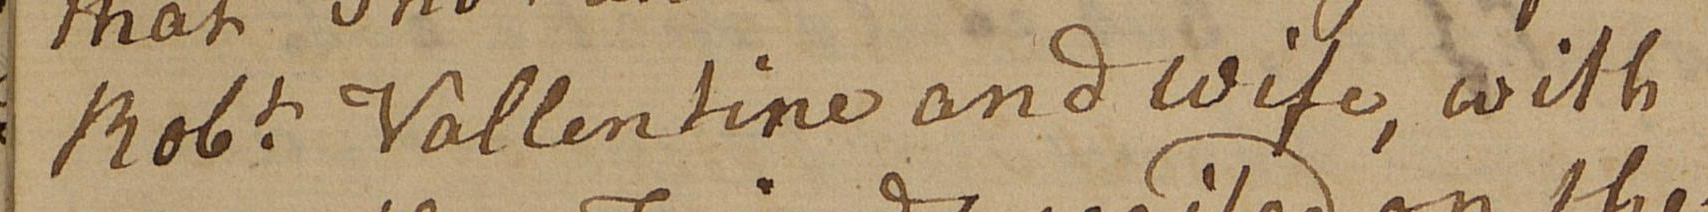Rob^t. Vallentine and Wife, with
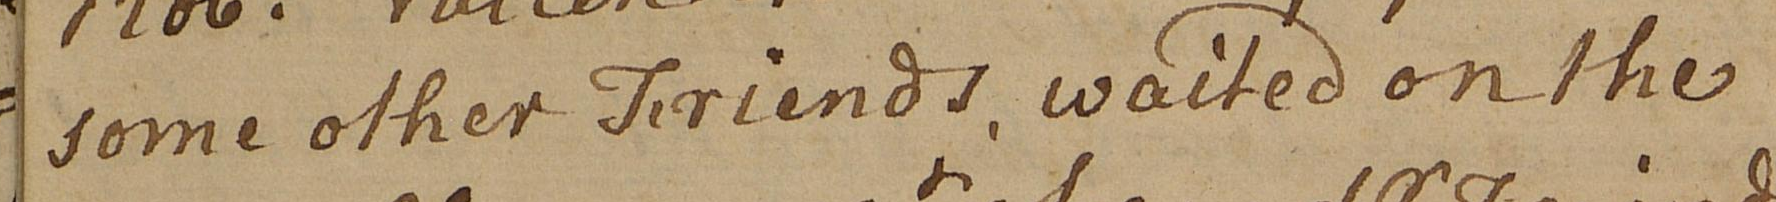some other Friends, waited on the
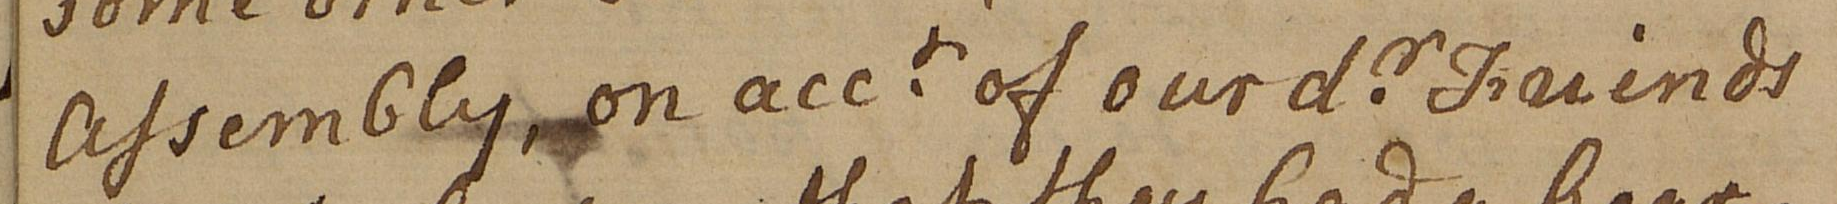Assembly, on acc^t. of our d^r. Friends
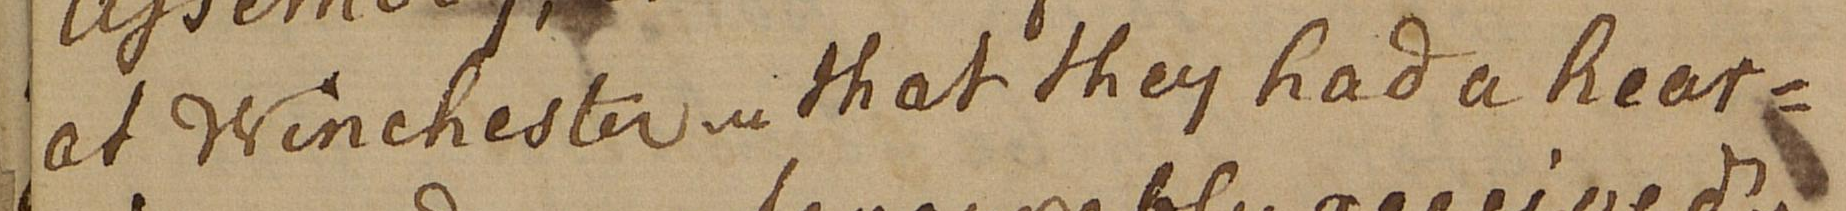at Winchester- that they had a hear-
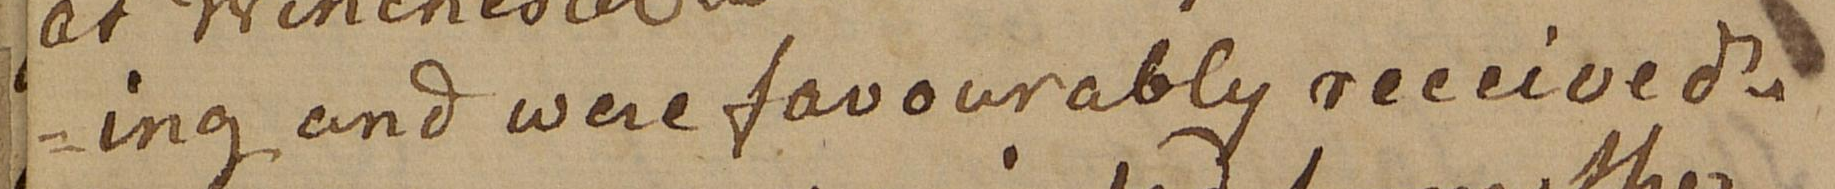-ing and were favourably received-
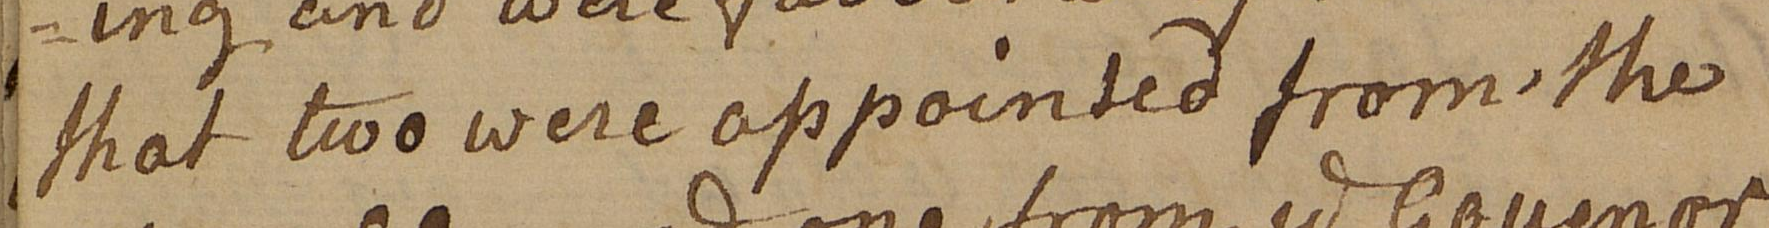that two were appointed from the
